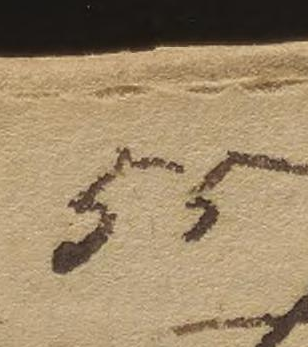55
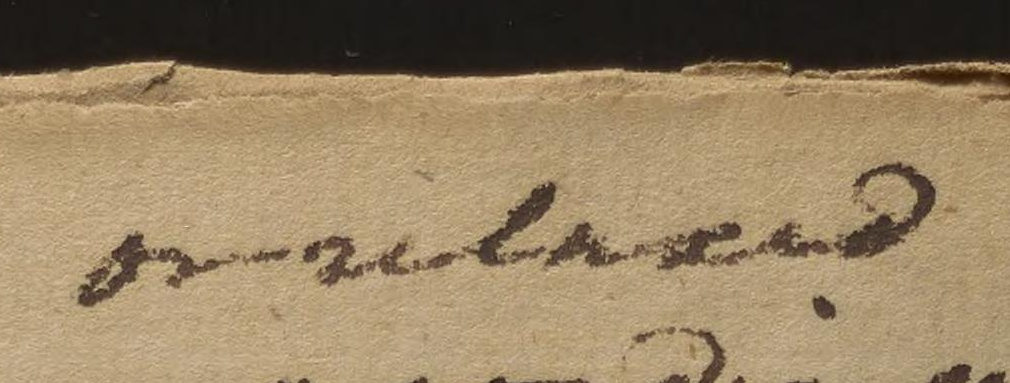or relaxed
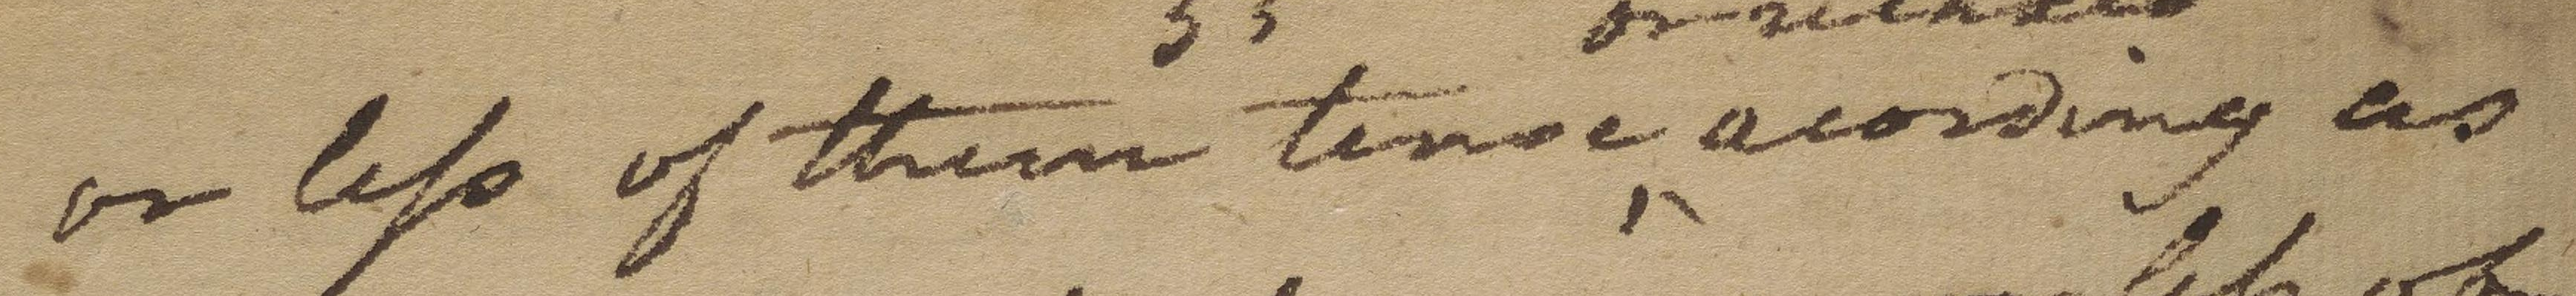or less of them tense ^ according as
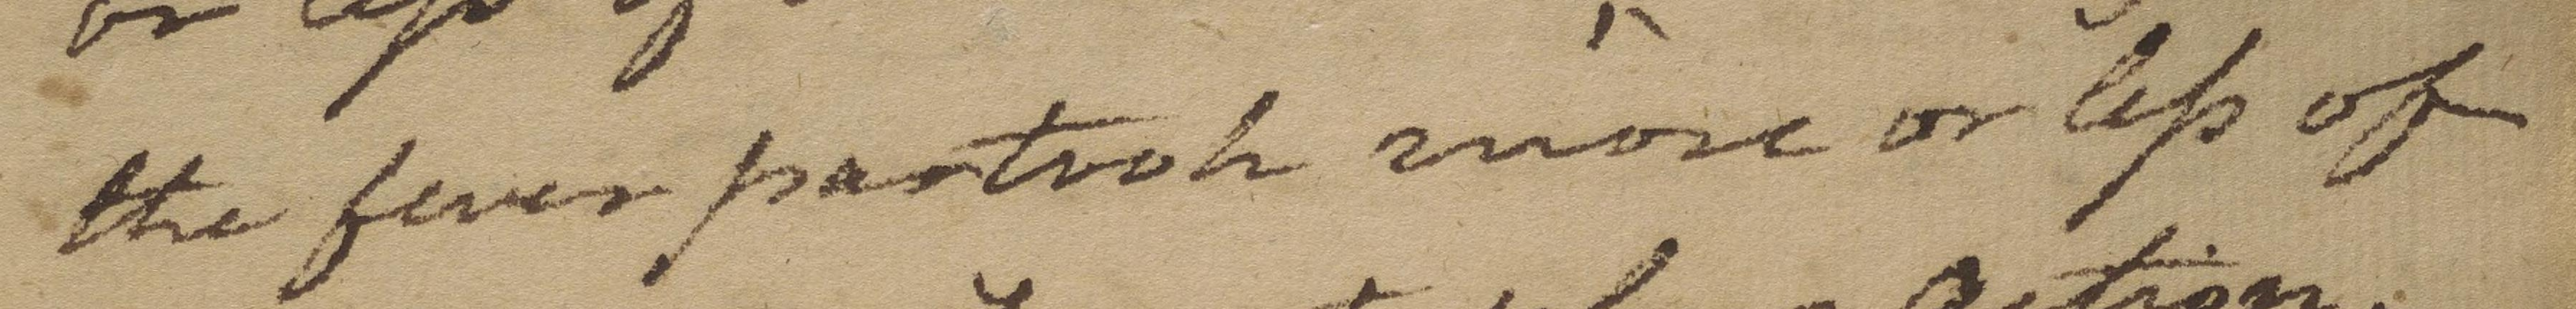the fever partook more or less of
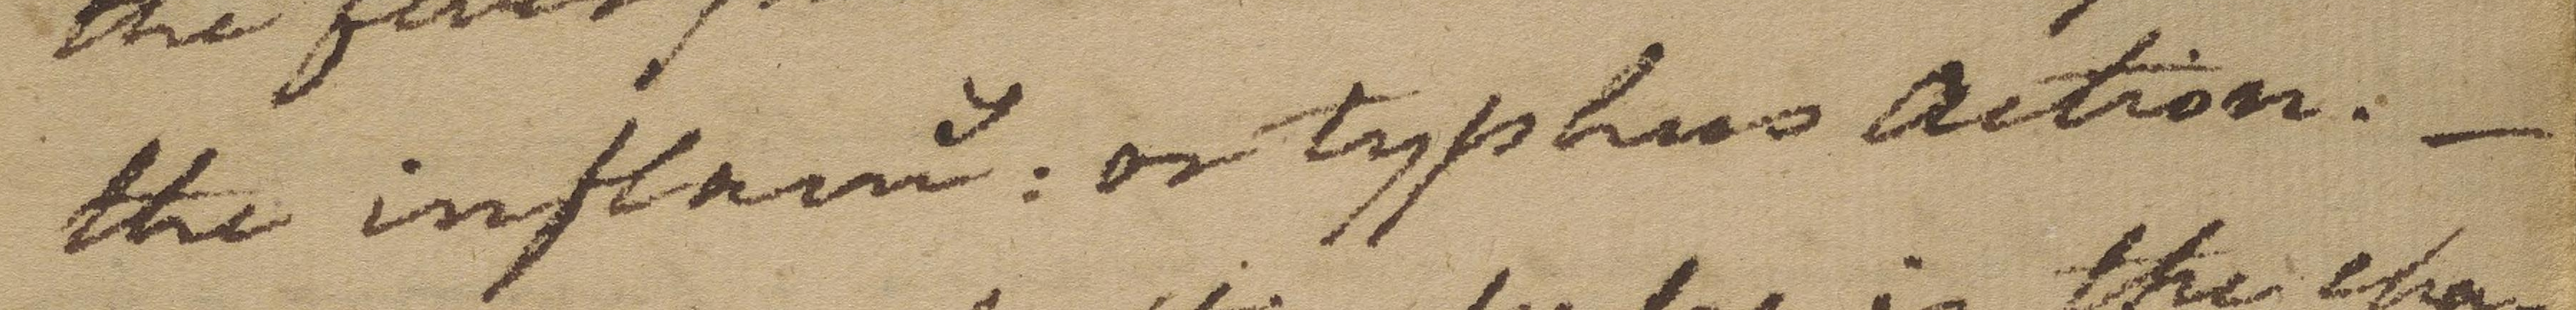the inflam^y: or typhus Action.
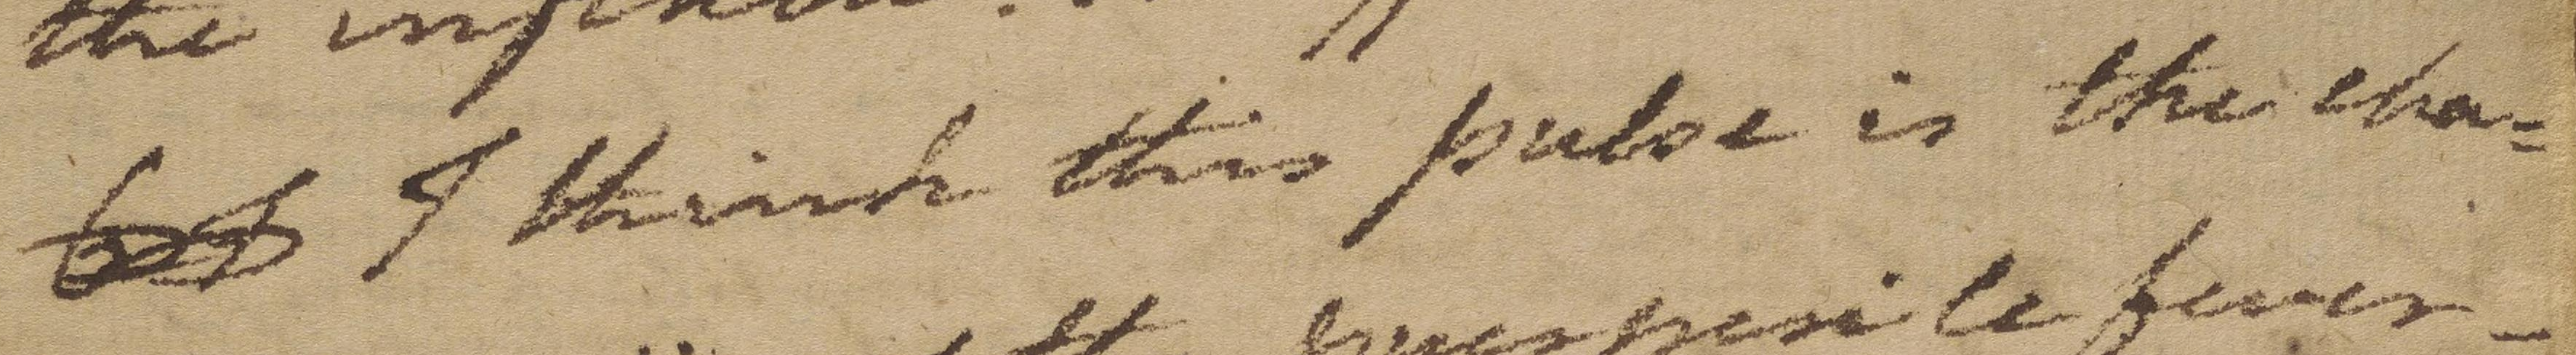[but] I think this pulse is the cha-
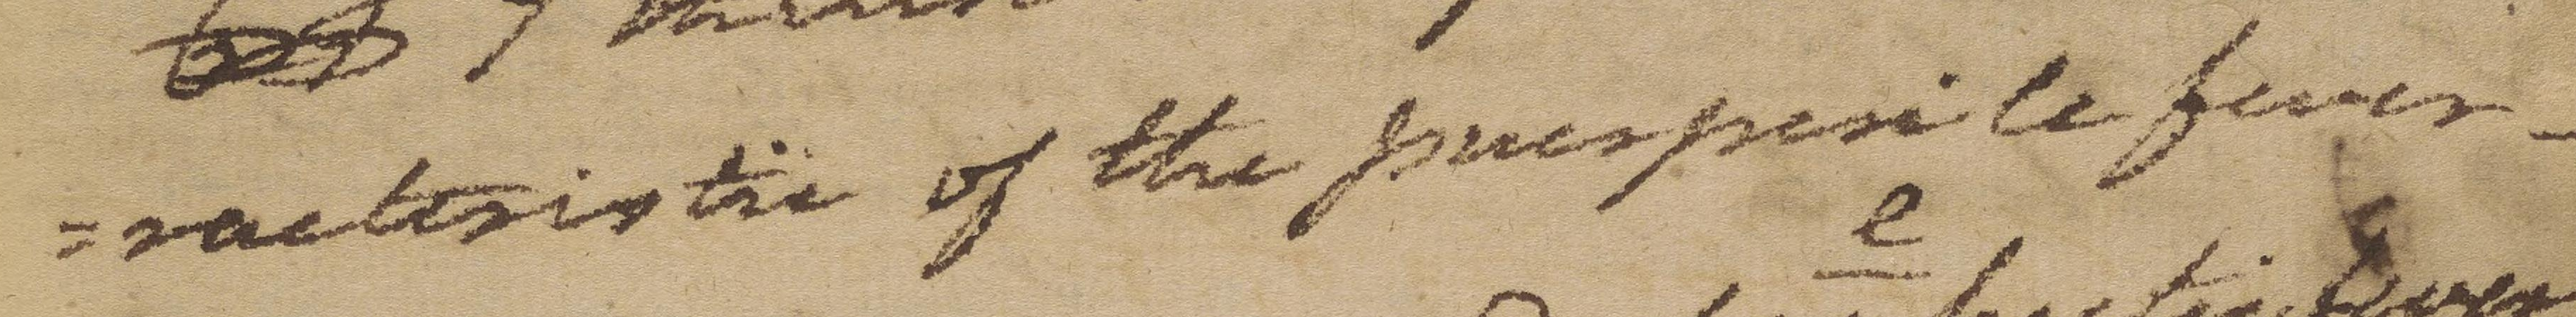-racteristic of the puerperile fever
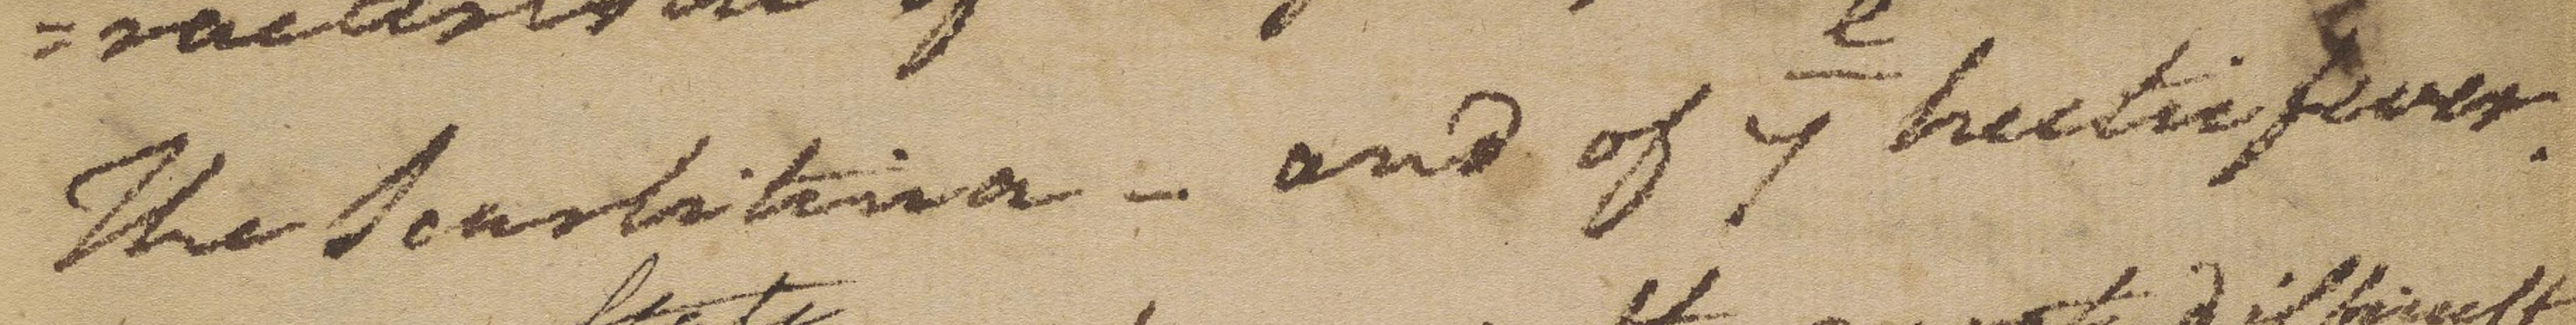The Sourlitrina, and of y^e hectic fever.
